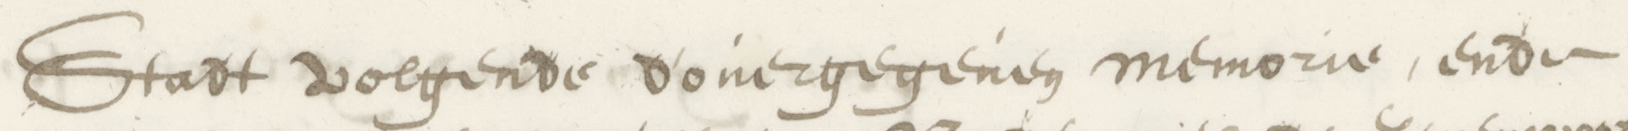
Stadt volgende d'ouergegeuen memorie, ende
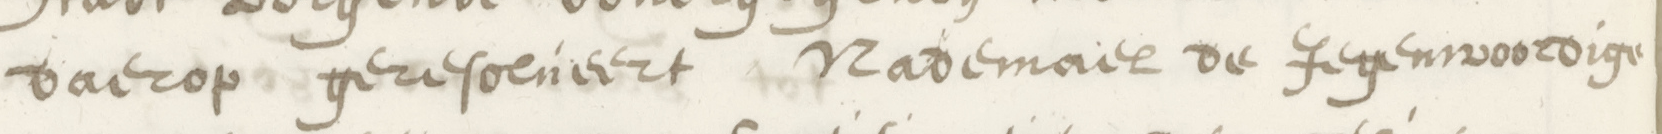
daerop geresolueert, nademael de jegenwoordige
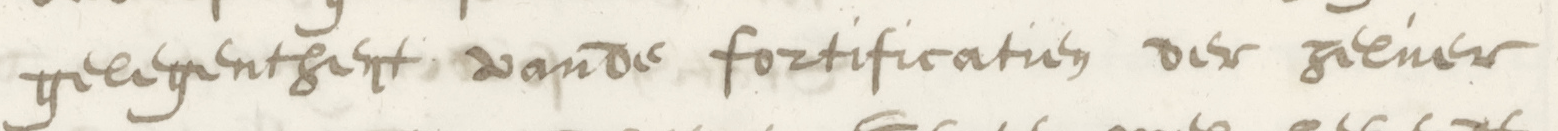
gelegentheyt, vande fortificatien der zeluer
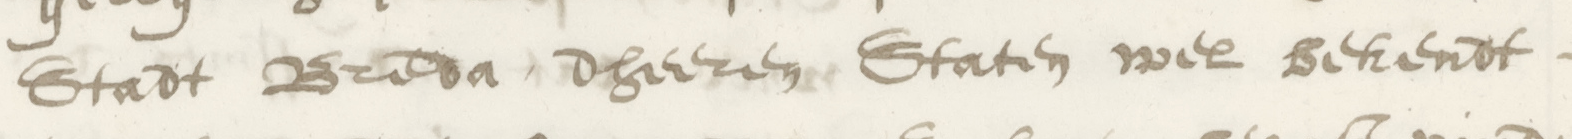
Stadt Breda, d'heeren, Staten wel bekendt
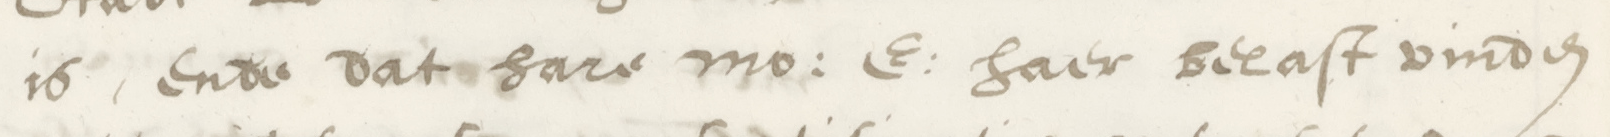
is, ende dat hare Mo: E: haer belast vinden
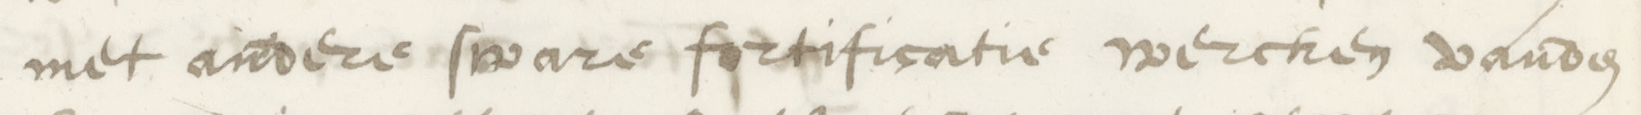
met andere sware fortificatie wercken vanden
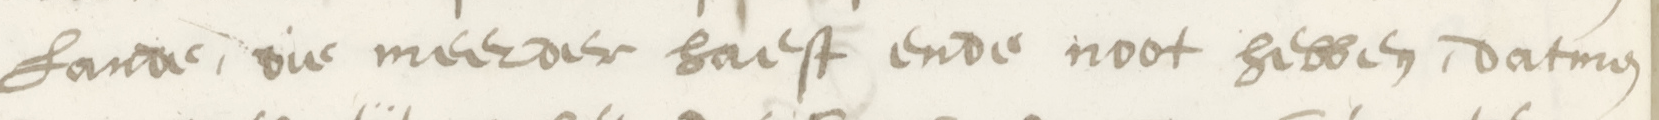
Lande, die meerder haest ende noot hebben, datmen
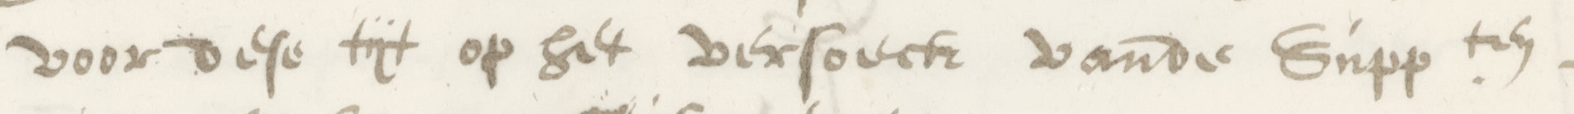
voor dese tijt op het versoeck vande Suppten.
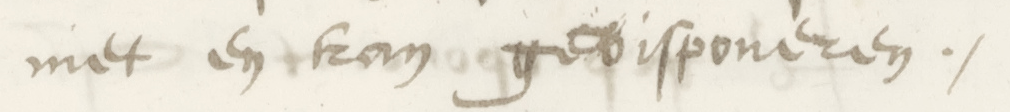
niet en kan gedisponeren.
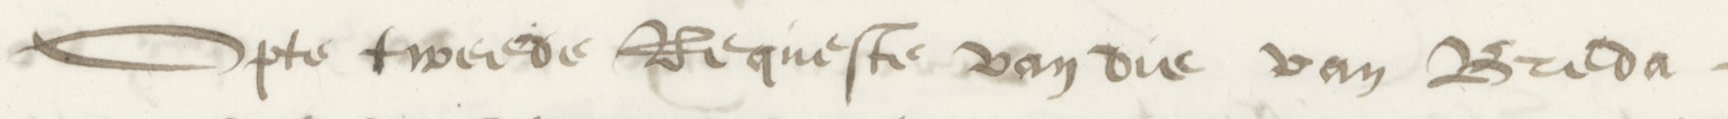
Opte tweede Requeste van die van Breda
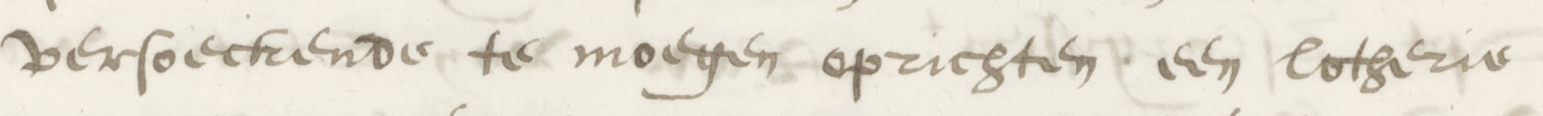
versoeckende te moegen oprichten, een lotherie
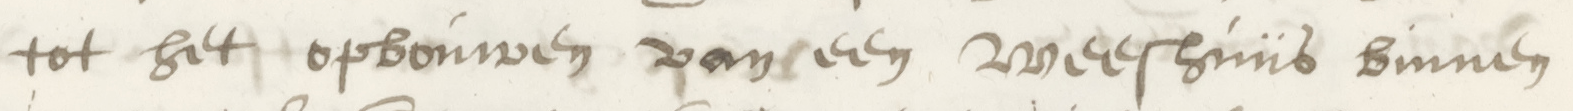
tot het opbouwen van een weeshuijs binnen
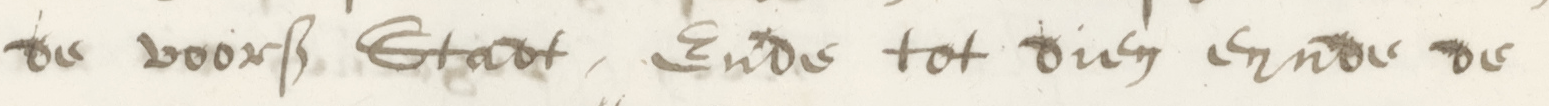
de voors Stadt, Ende tot dien eynde de
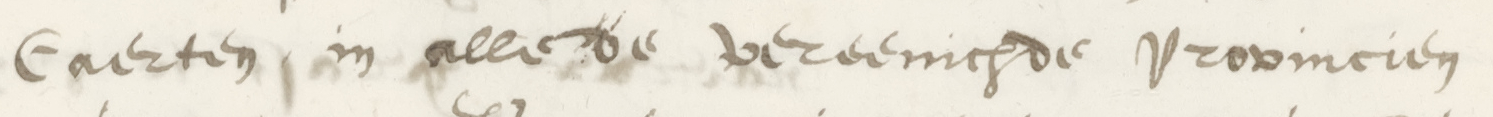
Caerten, in alle de vereenichde provincien
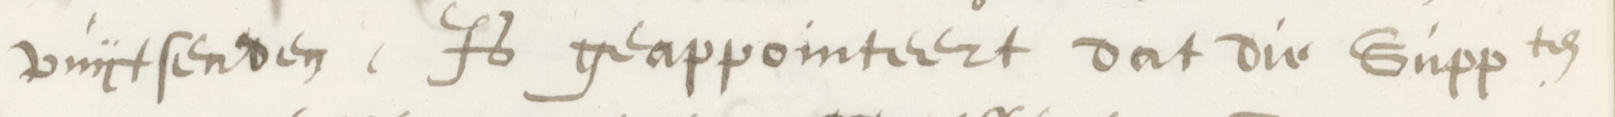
vuijtsenden, Is geappointeert dat die Suppten
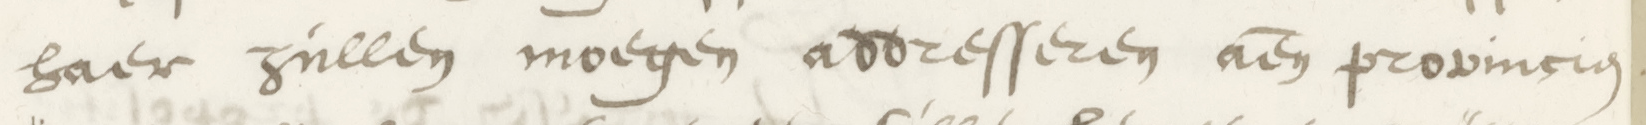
haer zullen moegen addresseren aen provincien
